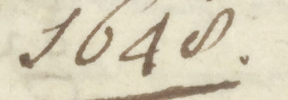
1648.
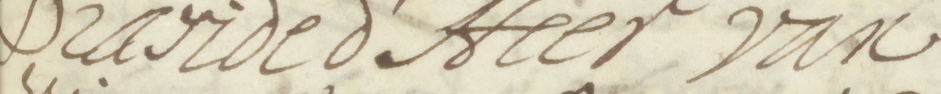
Praside d' Heer van
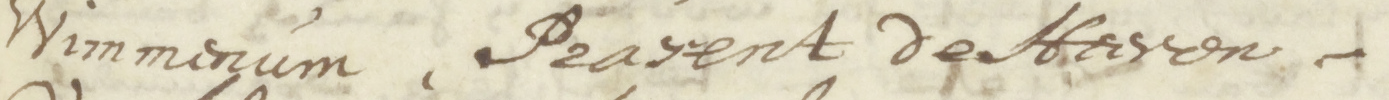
Wimmenum, Prasent de Heeren
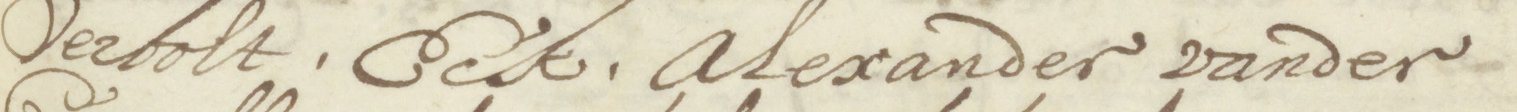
Verbolt, Eck, Alexander vander
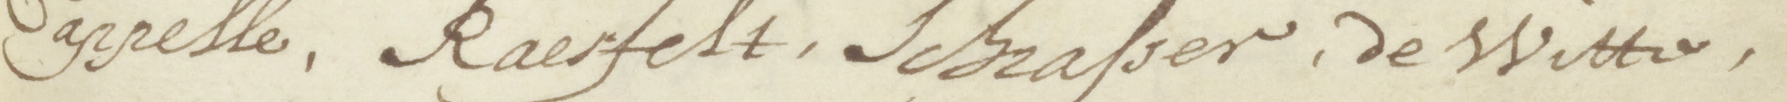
Cappelle, Raesfelt, Schrasser, de Witte,
